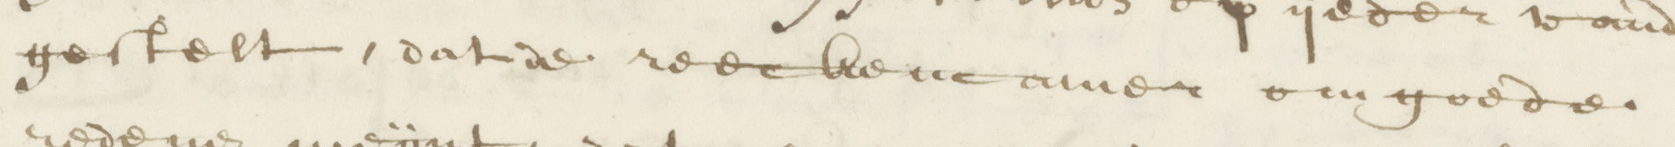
gestelt, dat de reeckencamer om goede
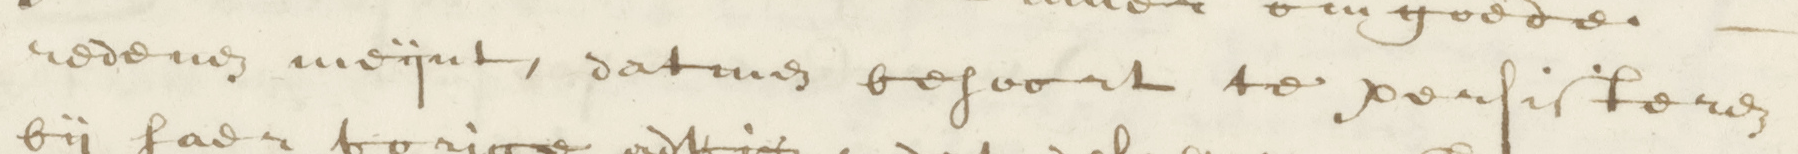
redenen meijnt, datmen behoort te persisteren
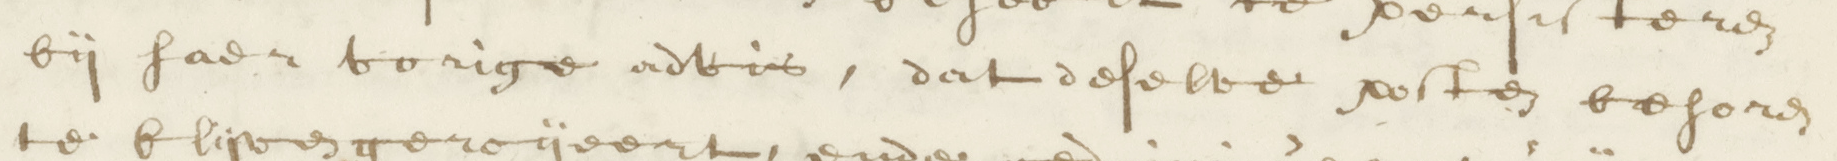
bij haer vorige advis, dat deselve posten behoren
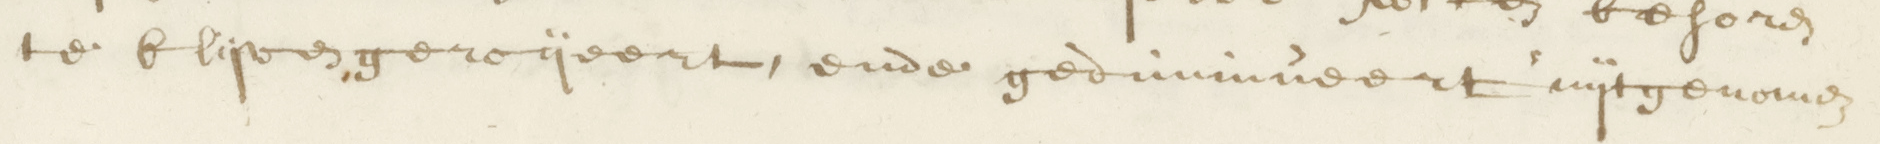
te blijven geroijeert, ende gediminueert uijtgenomen
